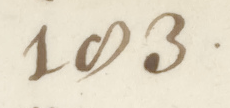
183
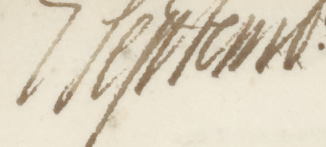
7 Septemb:
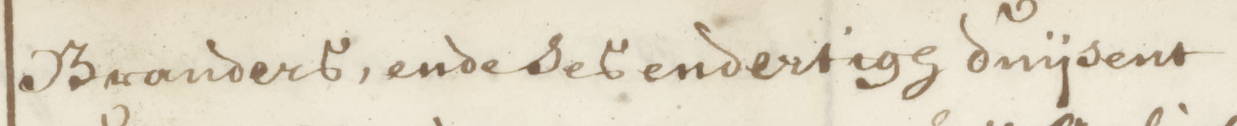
Branders, ende Ses endertigh duijsent
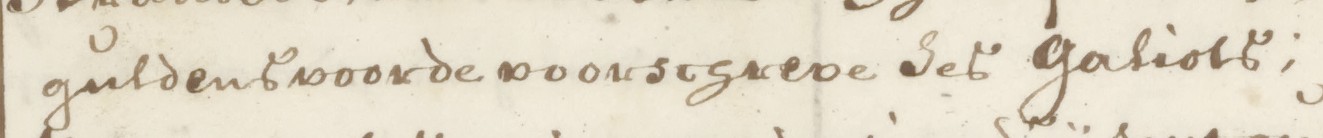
guldens voor de voorschreve Ses Galiots;
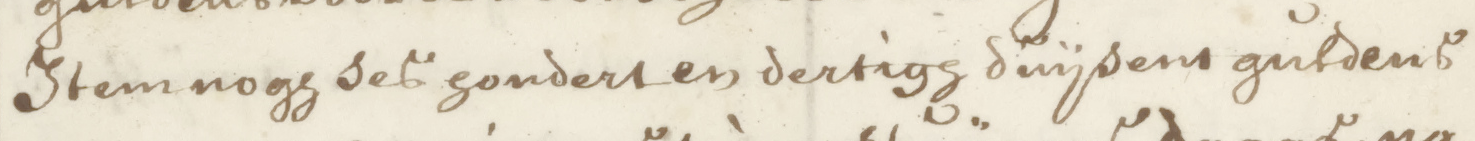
Item nogh Ses hondert en dertigh duijsent guldens
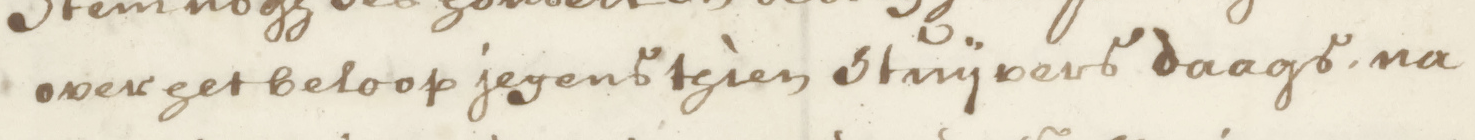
over het beloop jegens thien Stuijvers daags, na
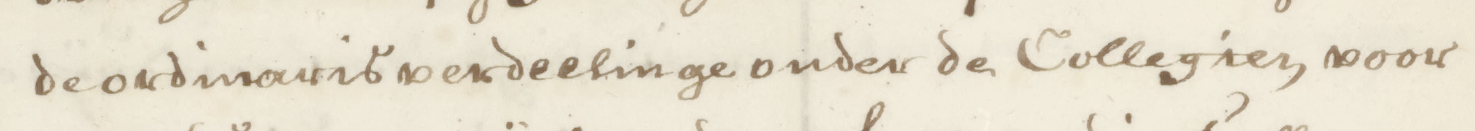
de ordinaris verdeelinge onder de Collegien voor
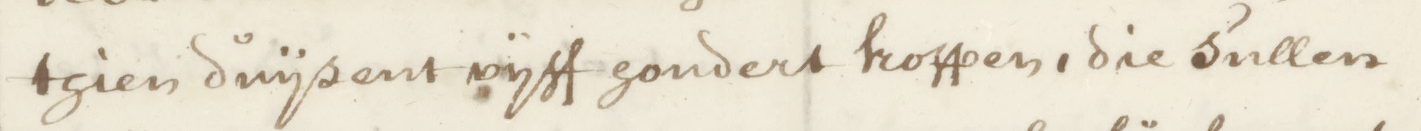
thien duijsent vijff hondert koppen, die sullen
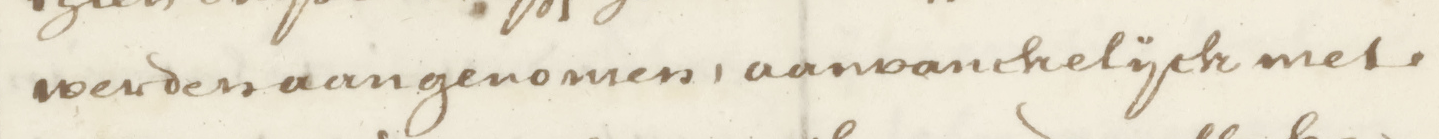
werden aangenomen, aanvanckelijck met
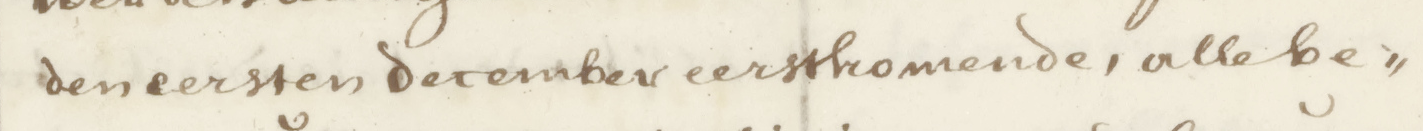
den eersten december eerstkomende, alle be„
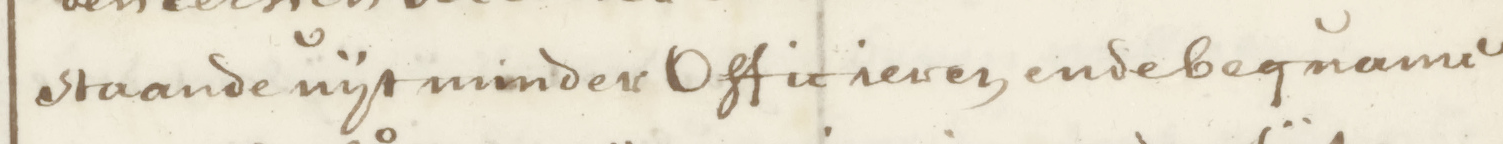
staande uijt minder Officieren ende bequame
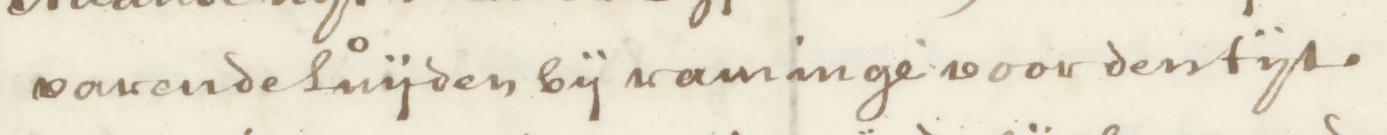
varende luijden bij raminge voor den tijt
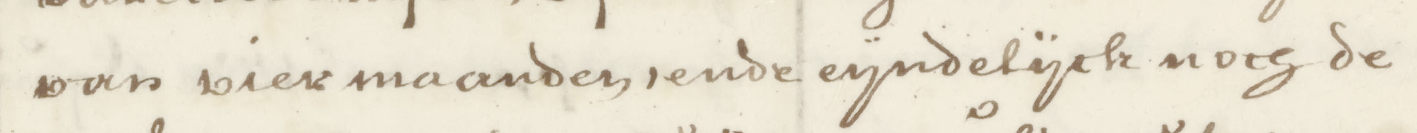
van vier maanden, ende eijndelijck noch de
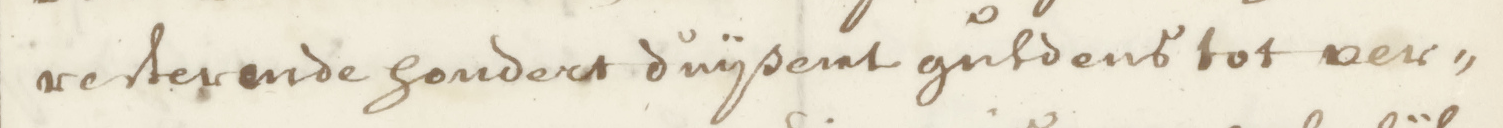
resterende hondert duijsent guldens tot ver„
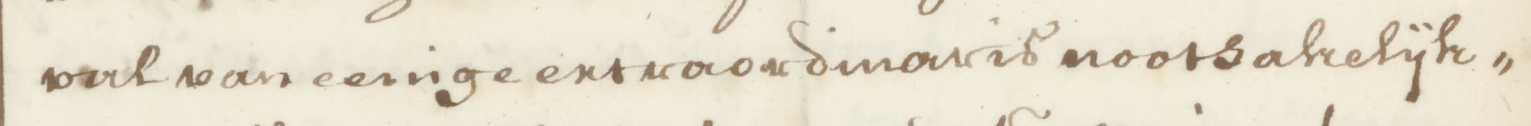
val van eenige extraordinaris nootsakelijk„
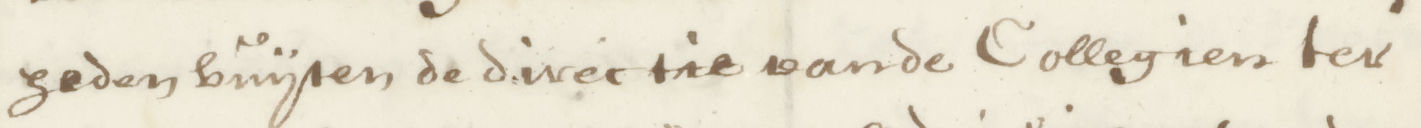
heden buijten de directie vande Collegien ter
